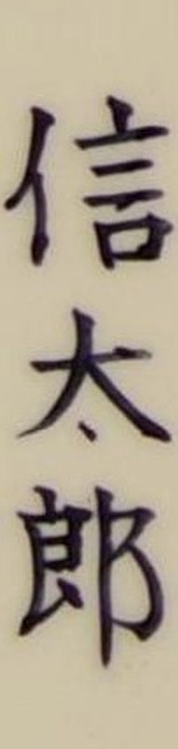信太郎
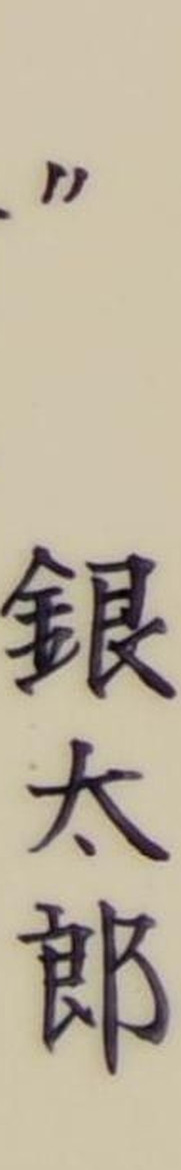銀太郎
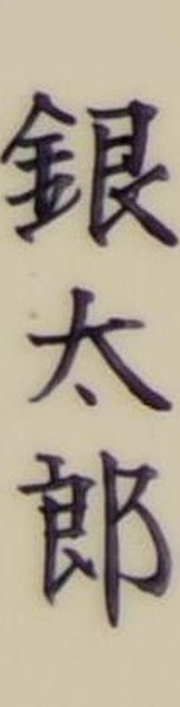銀太郎
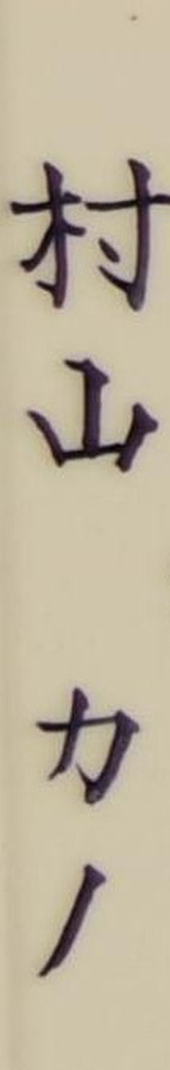村山カノ

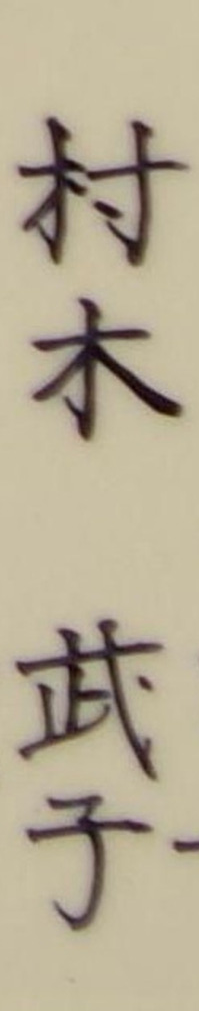村木武子
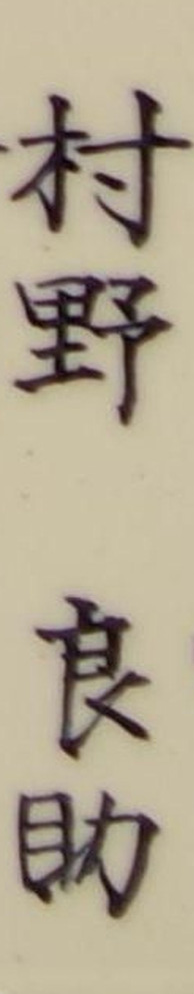村野良助
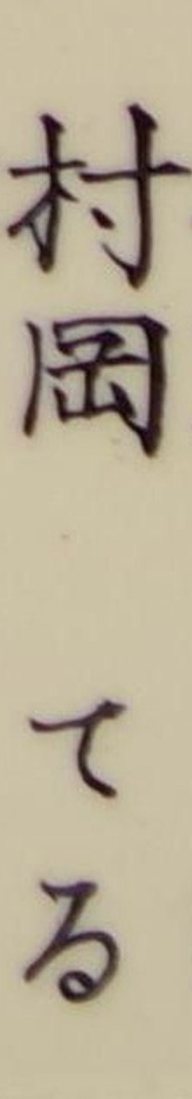村岡てる
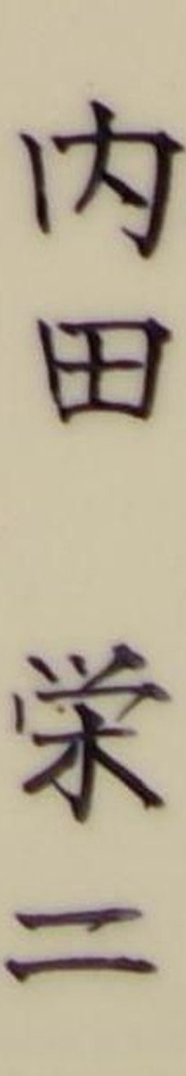内田栄二
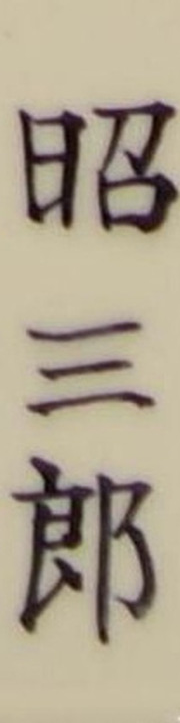昭三郎
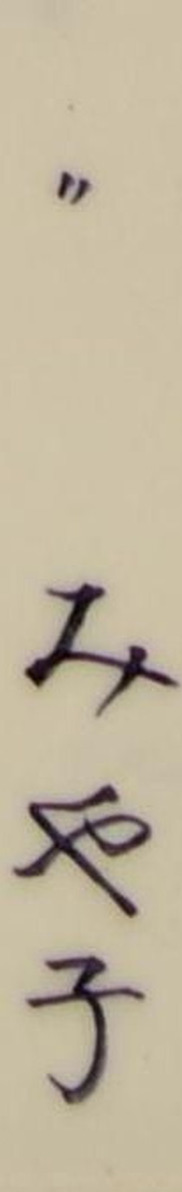みや子
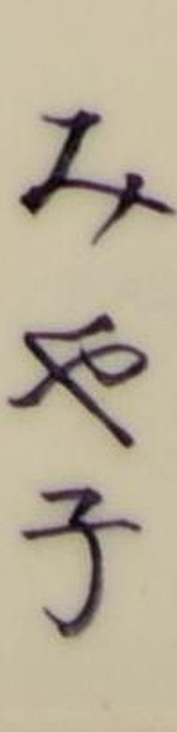みや子
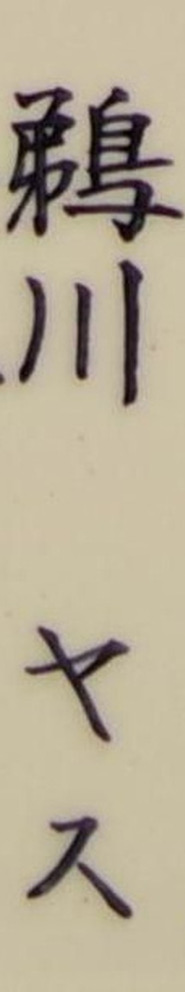鵜川ヤス
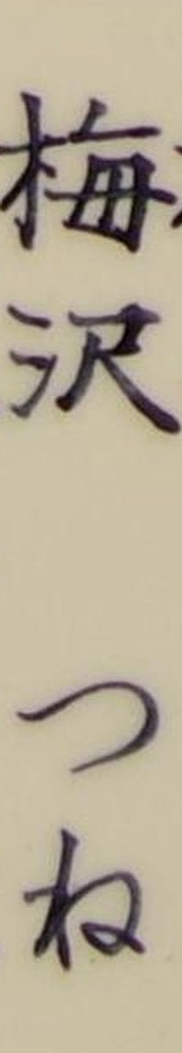梅沢つね
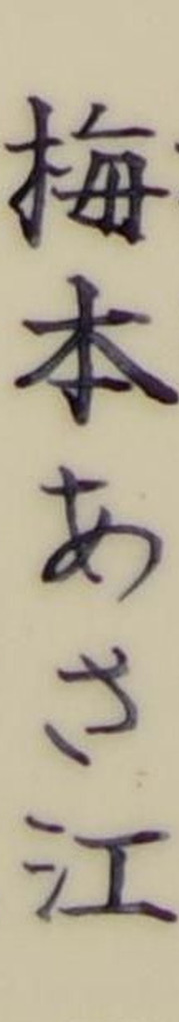梅本あさ江
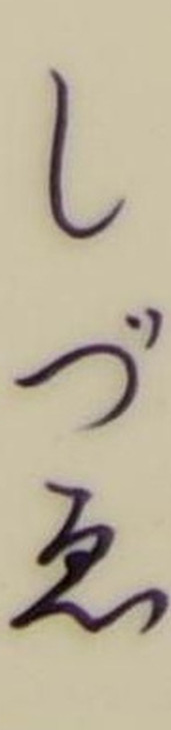しづえ
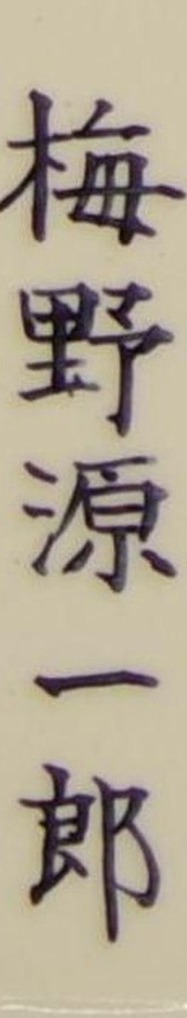梅野源一郎
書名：E~L
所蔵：高野山金剛峯寺
